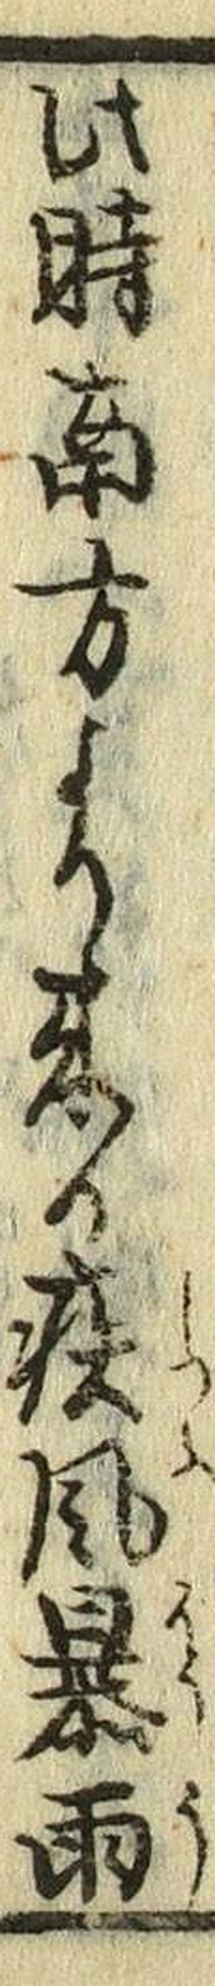此時南方より来る疾風暴雨
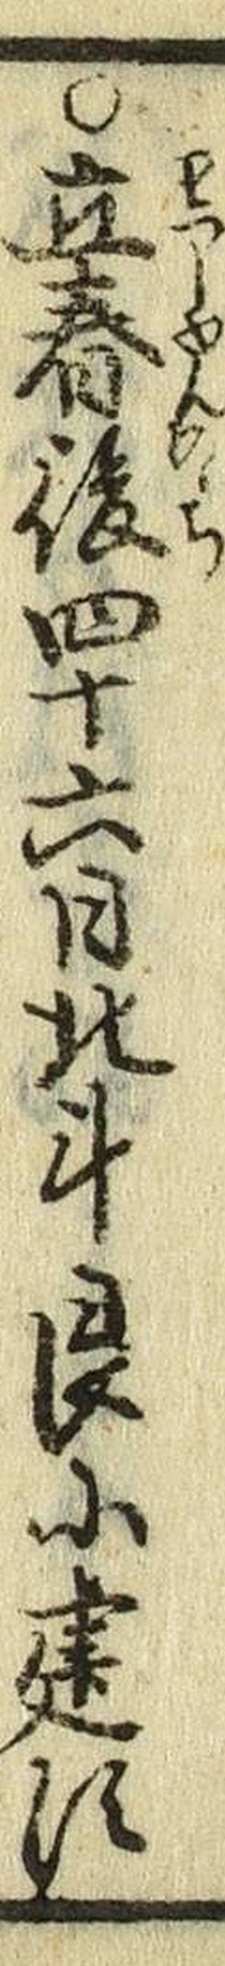○立春後四十六日北斗艮に建す
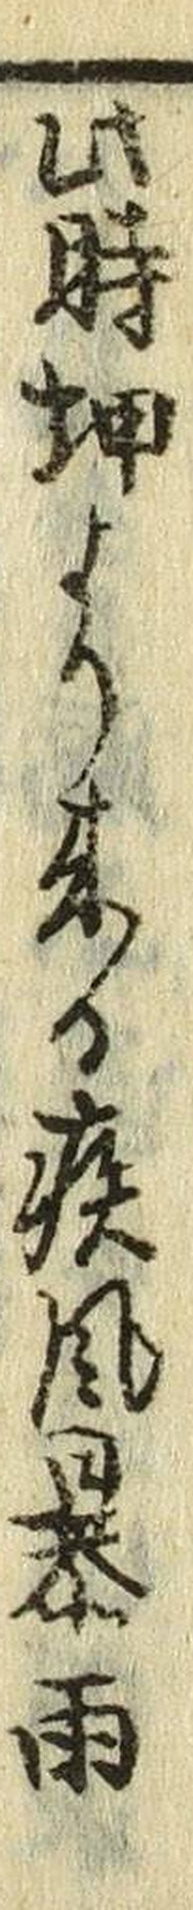此時坤より来る疾風暴雨
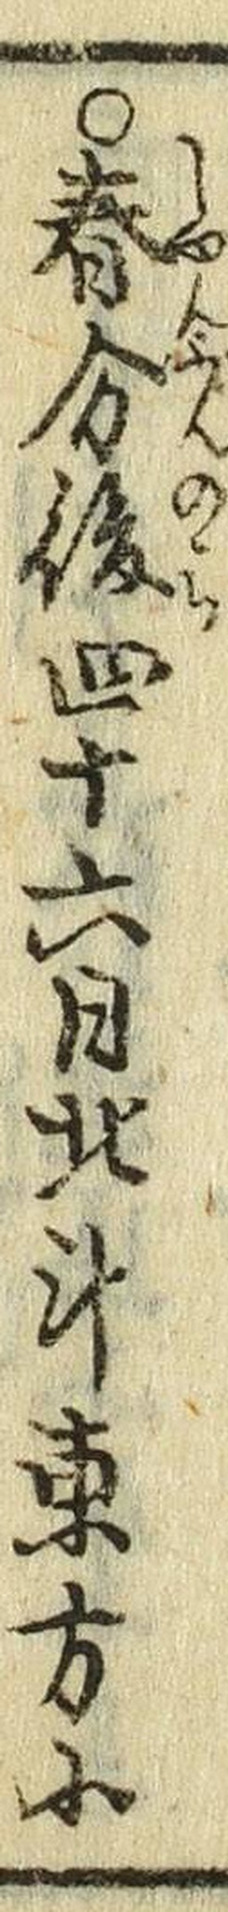○春分後四十六日北斗東方に
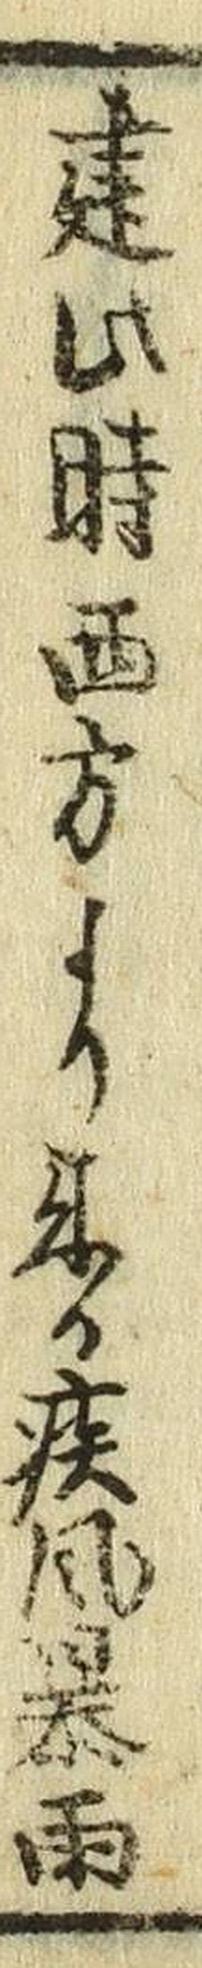建此時西方より来る疾風暴雨
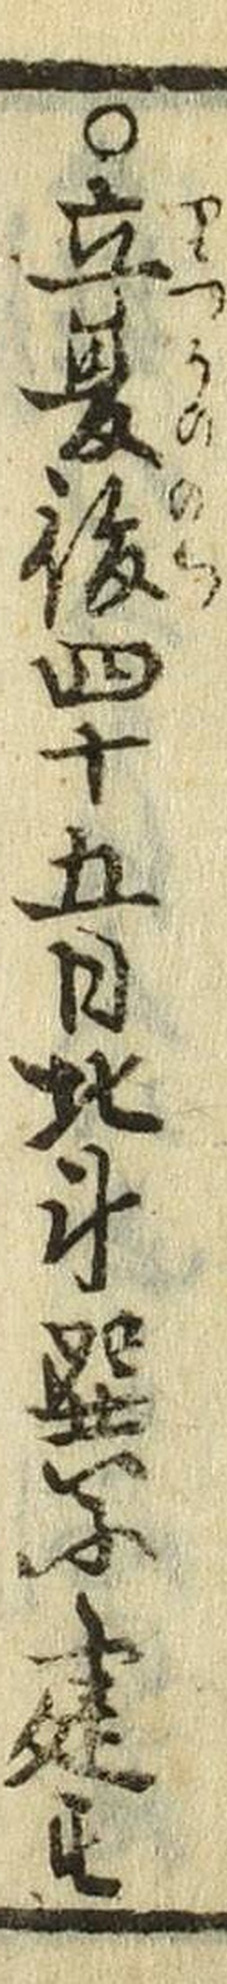○立夏後四十五日北斗巽に建す
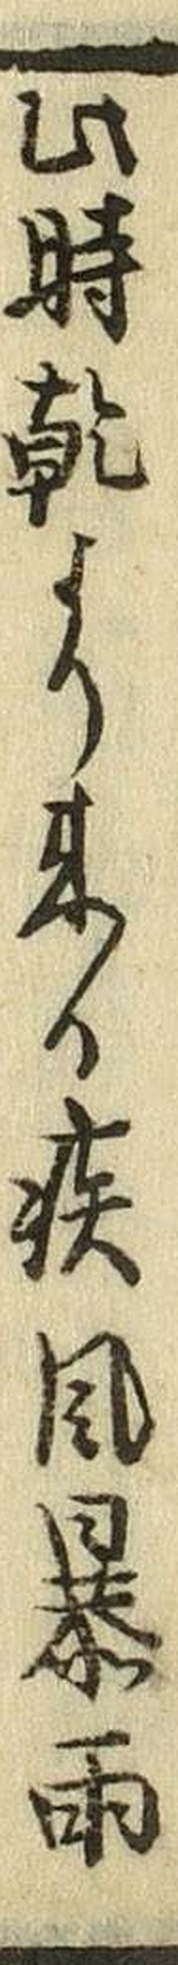此時乾より来る疾風暴雨
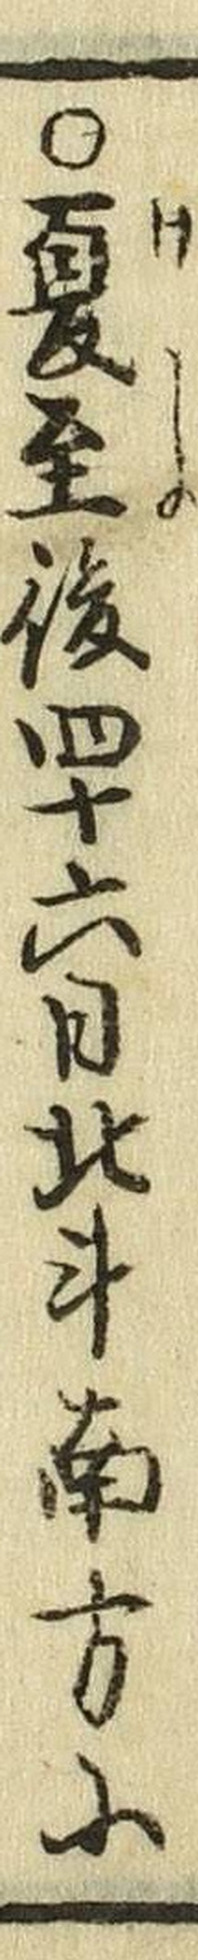○夏至後四十六日北斗南方に
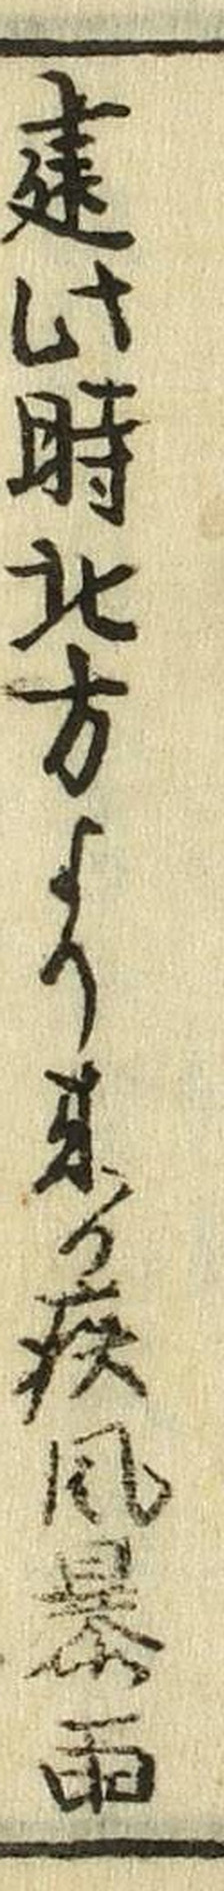建此時北方より来る疾風暴雨
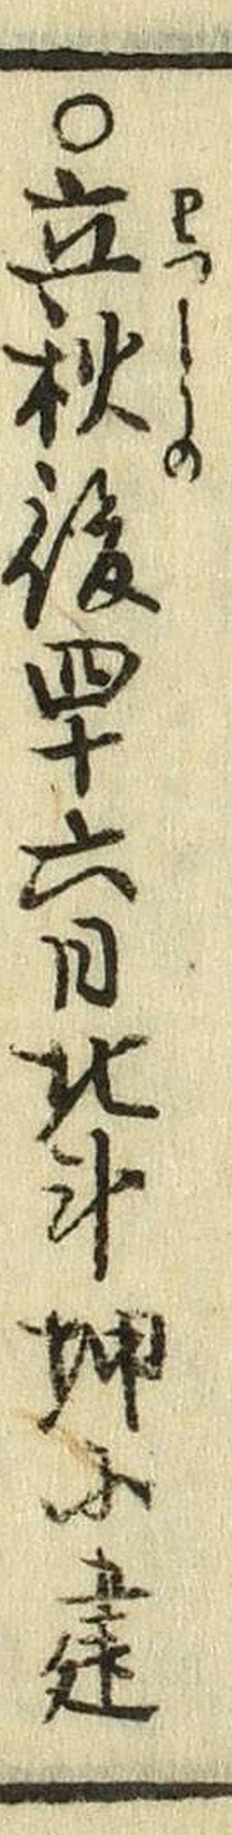○立秋後四十六日北斗坤に建
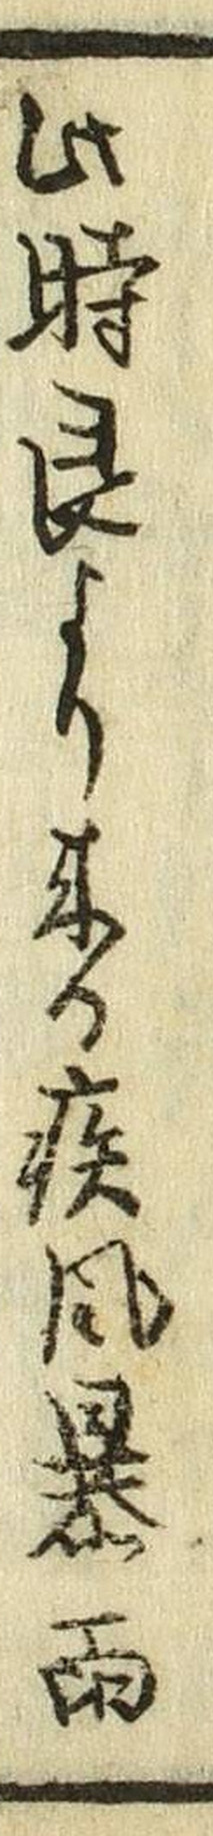此時艮より来る疾風暴雨
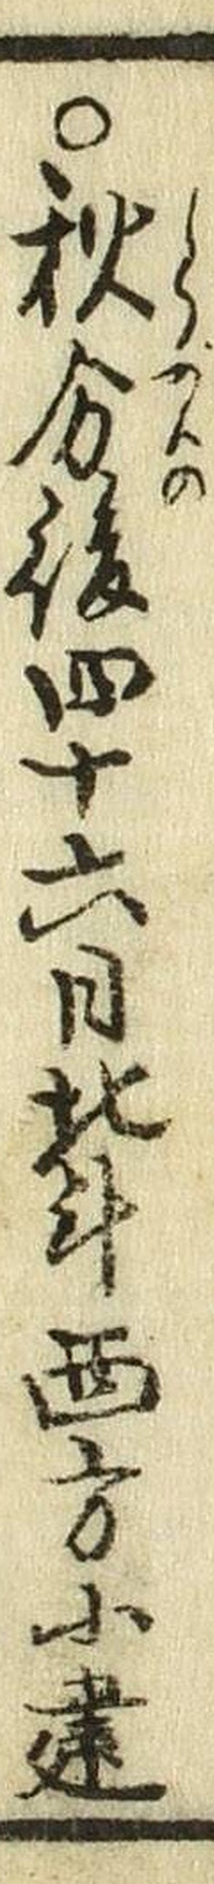○秋分の後四十六日北斗西方に建
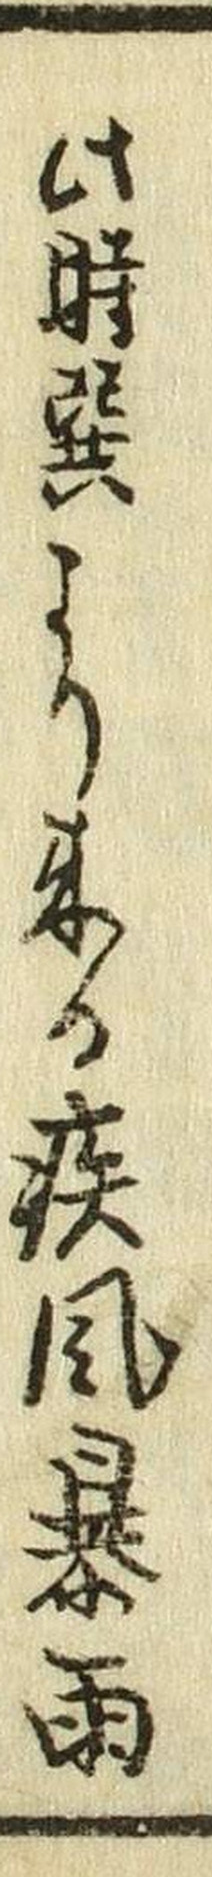此時巽より来る疾風暴雨
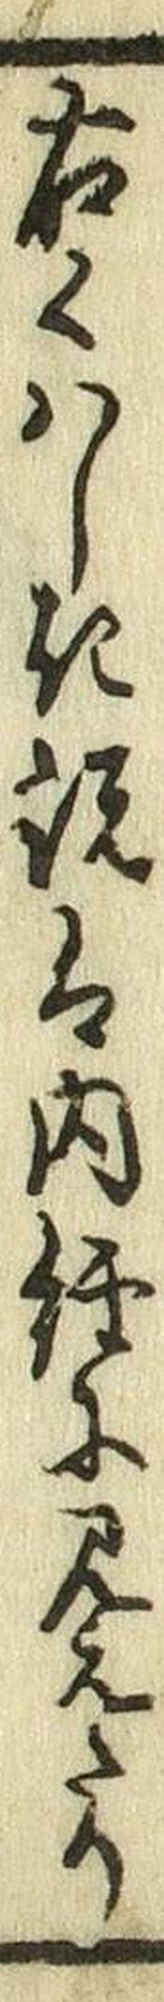右くはしき説は内経に見えたり

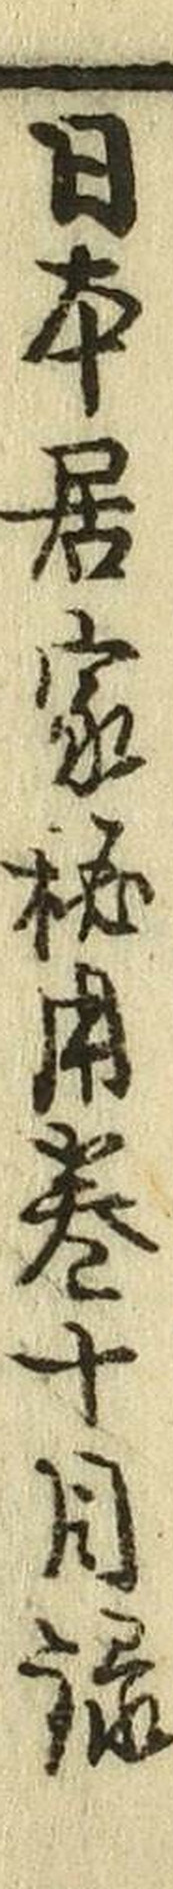日本居家秘用巻十目録
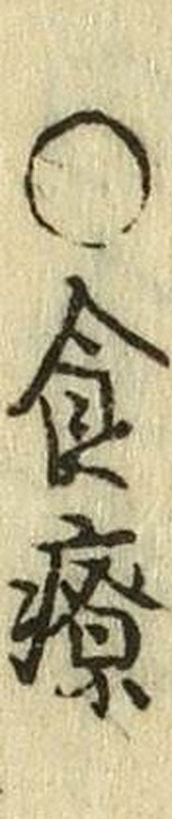○食療
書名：居家養生記
